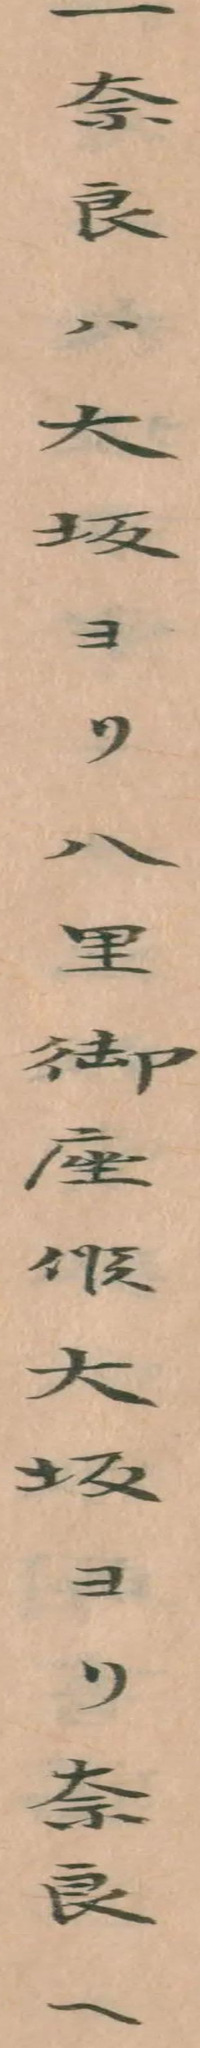一奈良ハ大坂ヨリ八里御座候大坂ヨリ奈良へ
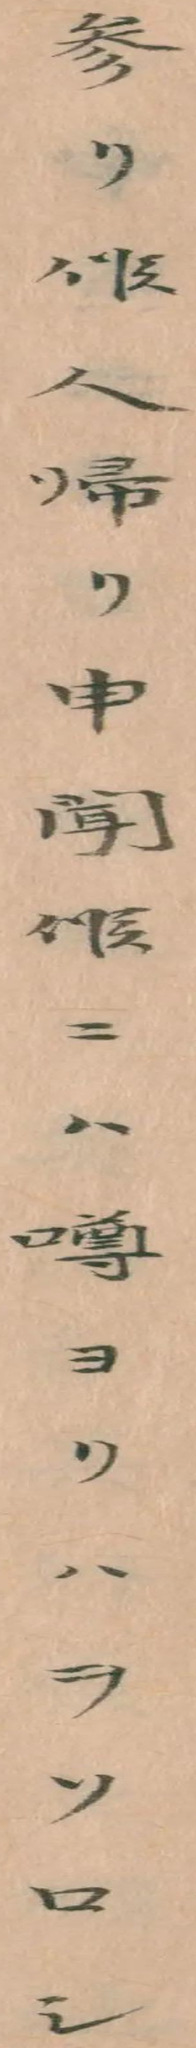参り候人帰り申聞候ニハ噂ヨリハヲソロシ
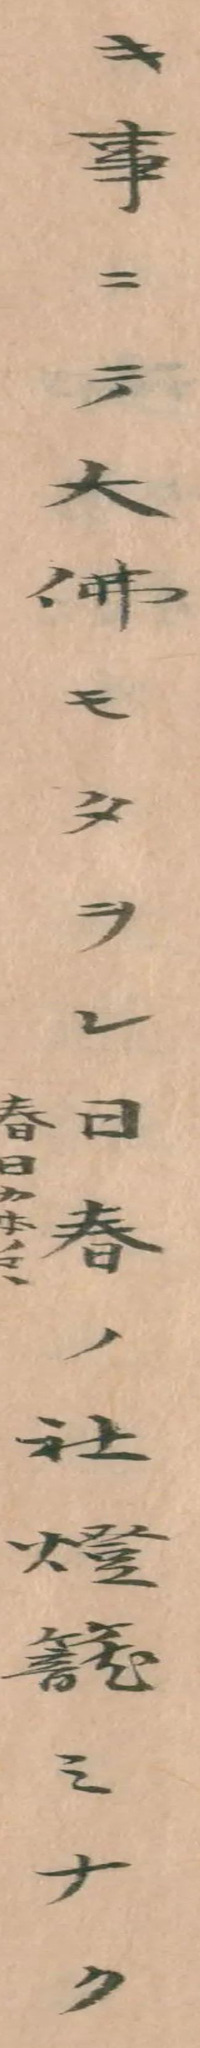キ事ニテ大仏モタヲレ日春之社燈籠ミナク
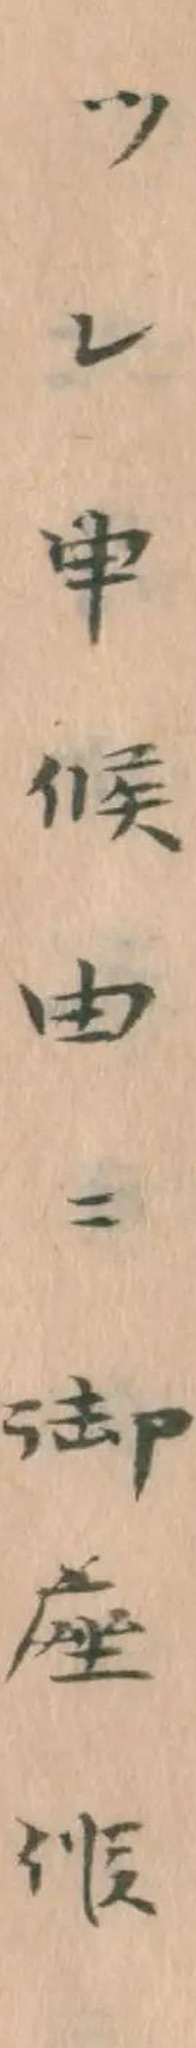ツレ申候由二御座候
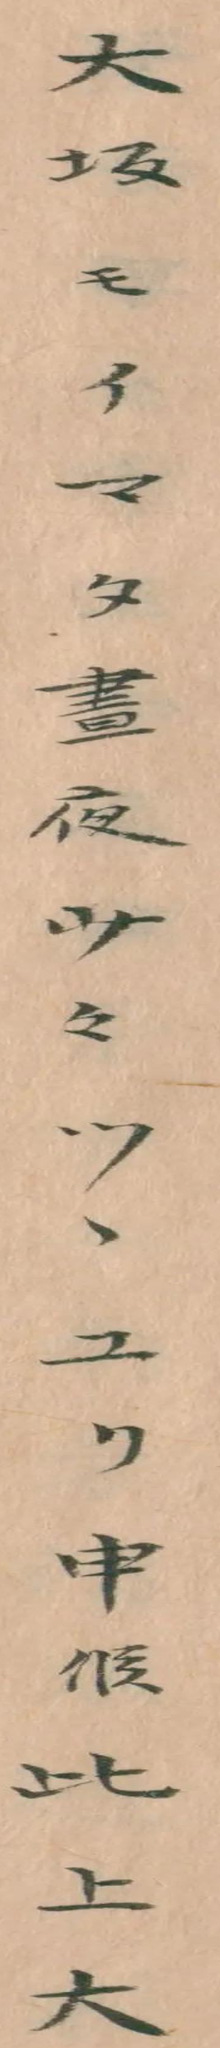一大坂モイマタ晝夜少々ツゝユリ申候此上大
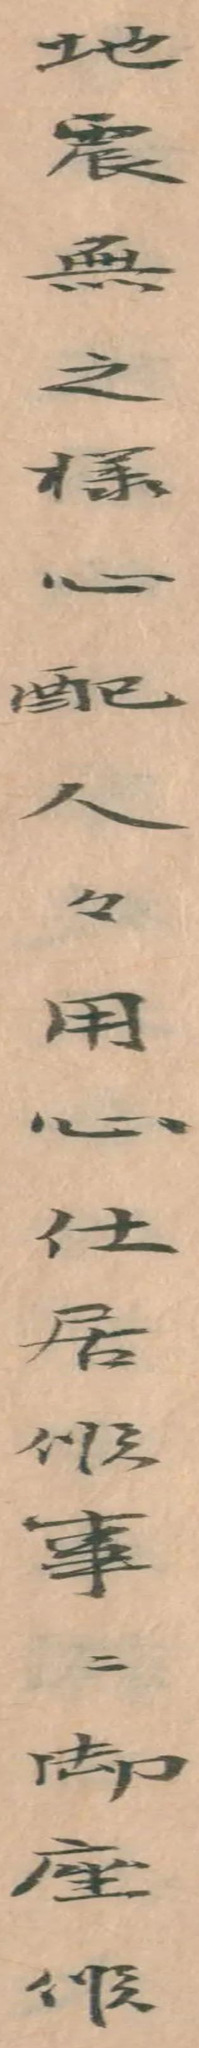地震無之様心配人々用心仕居候事二御座候

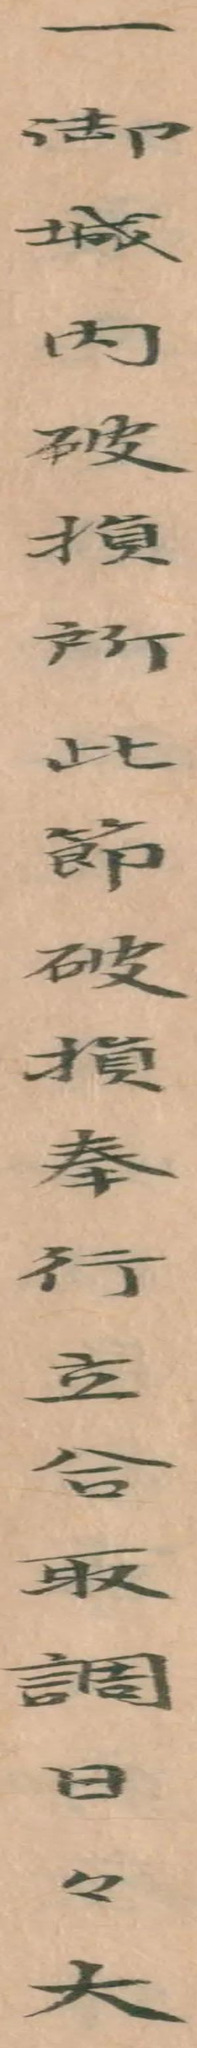一御場内破損所此節破損奉行立合取調日々大
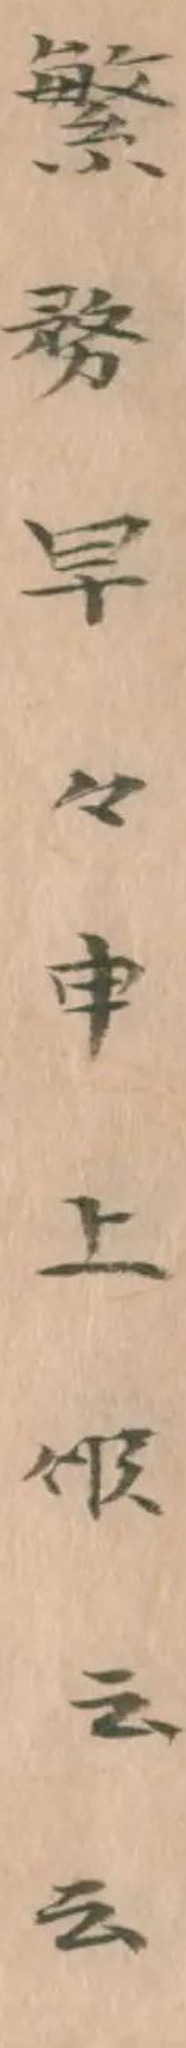繁盛早々申上候云云
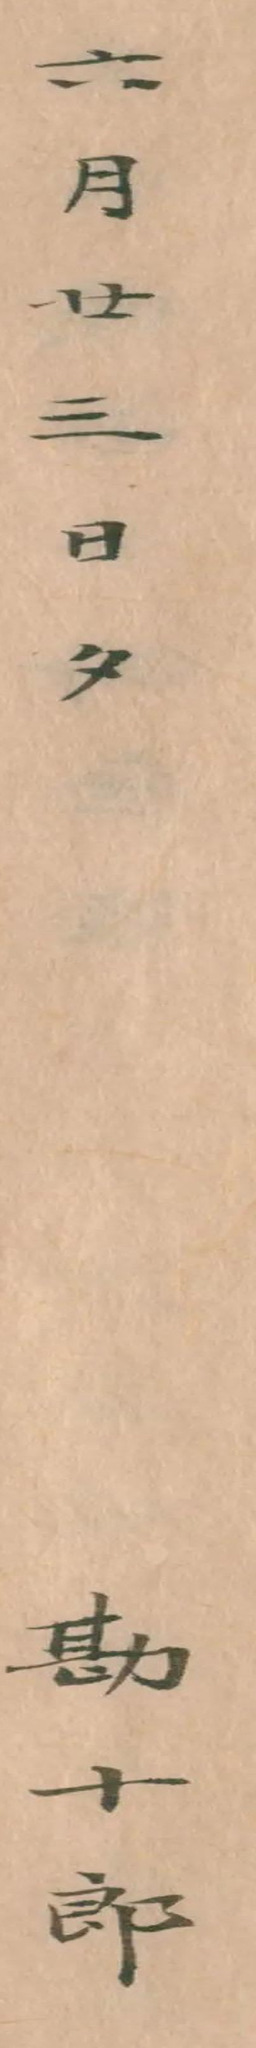六月廿三日夕勘十郎
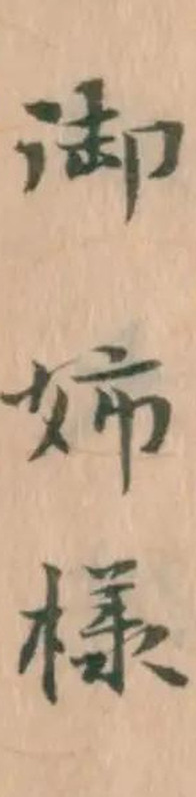御姉様
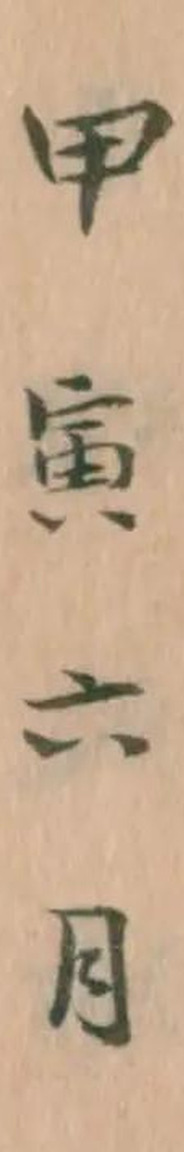甲寅六月
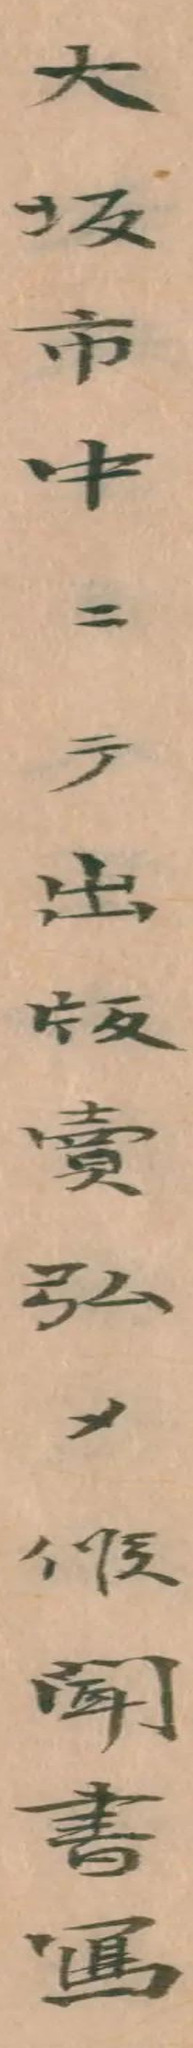大坂市中ニテ出版売弘メ候聞書写
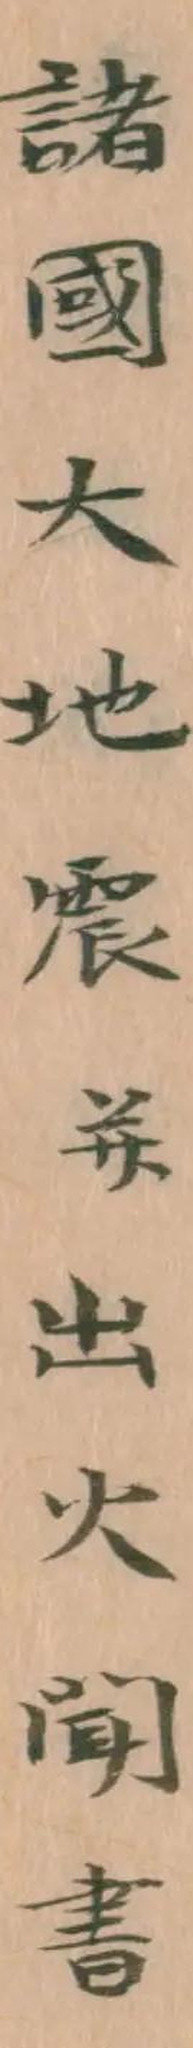諸国大地震并出火聞書
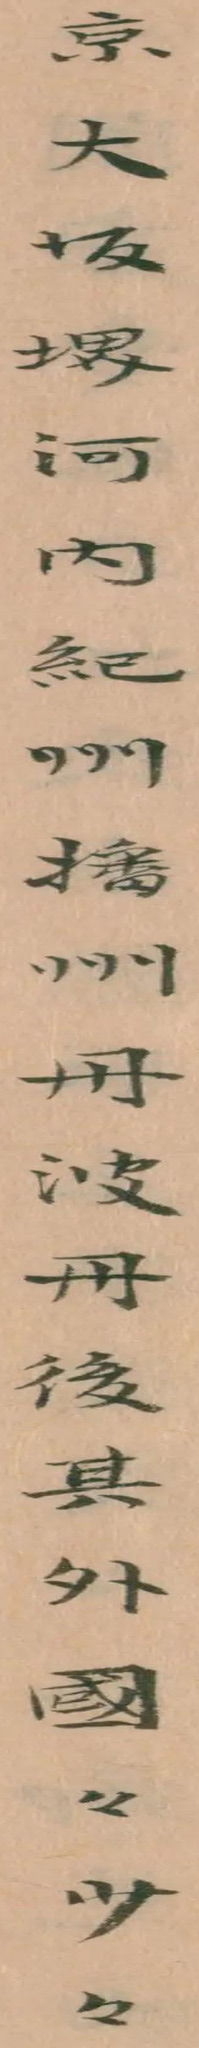京大坂堺河内紀州播州丹波丹後其外国々少々
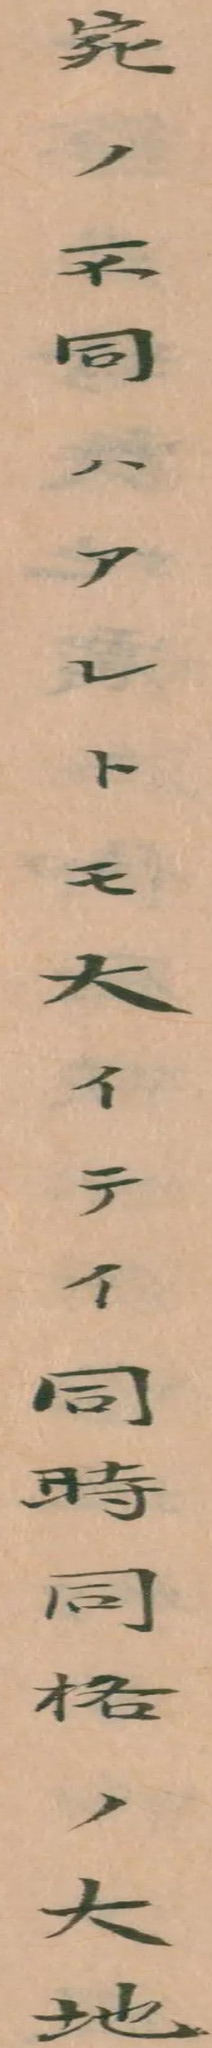宛ノ不同ハアレトモ大イテイ同時同格ノ大地
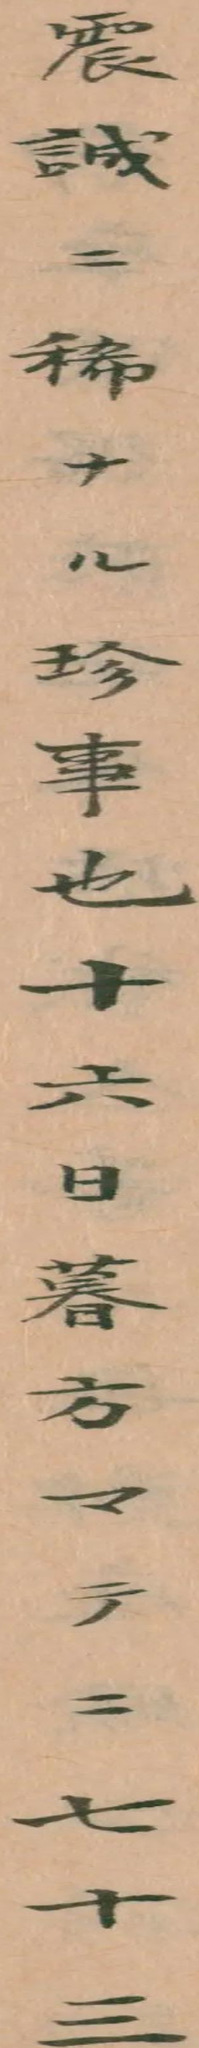震誠二稀ナル珍事也十六日暮方マデニ七十三
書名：地災撮要. 巻1(噴火山・地震ノ部)
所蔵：国立国会図書館 National Diet Library, JAPAN
